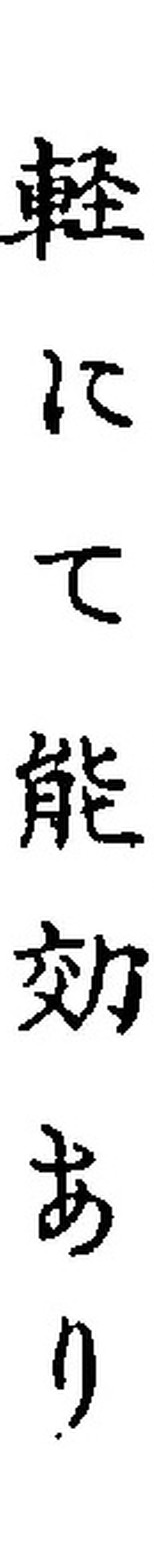軽にて能効あり
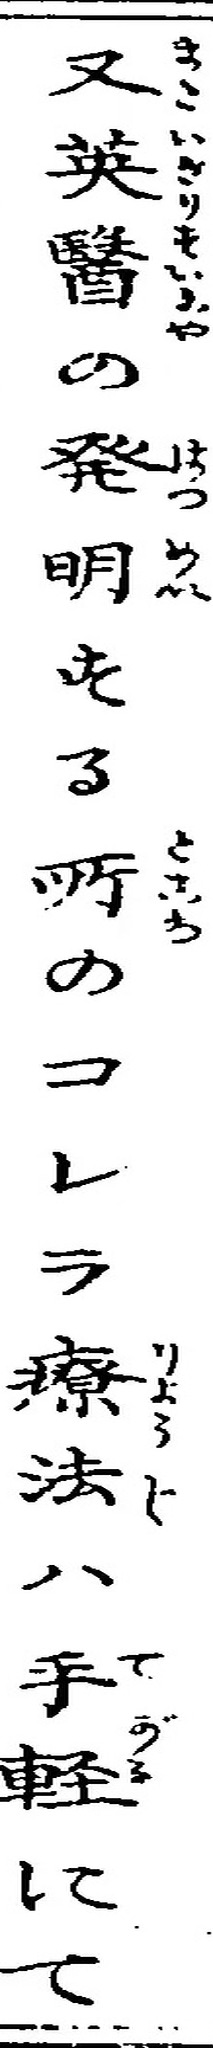又英醫の発明する所のコレラ療法は手軽にて

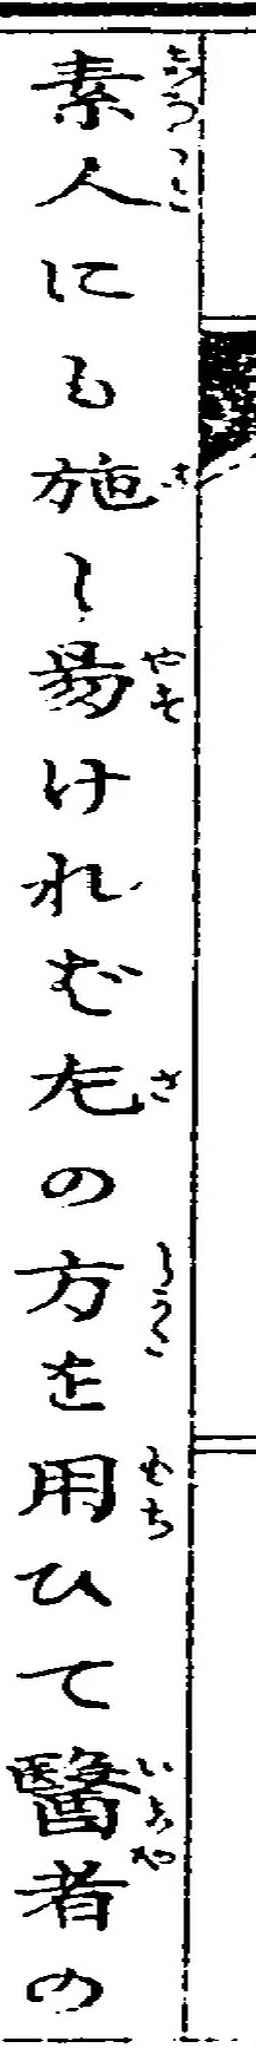素人にも施易ければ左の方を用ひて醫者の
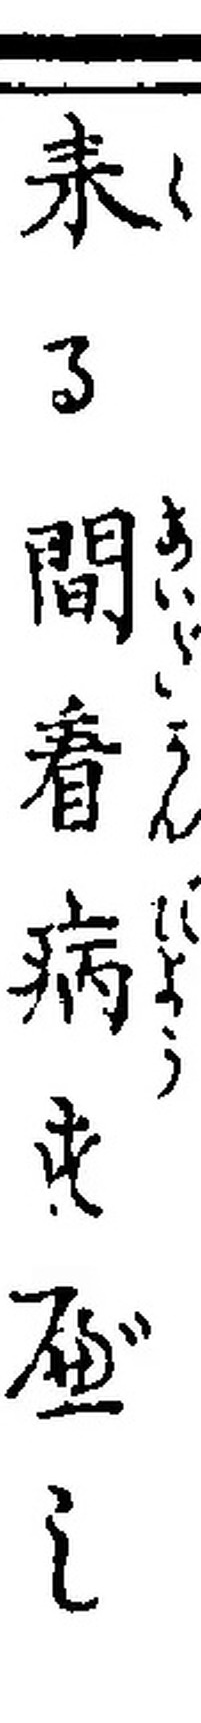来る間看病すべし
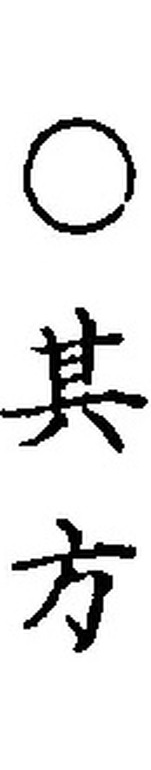〇其方
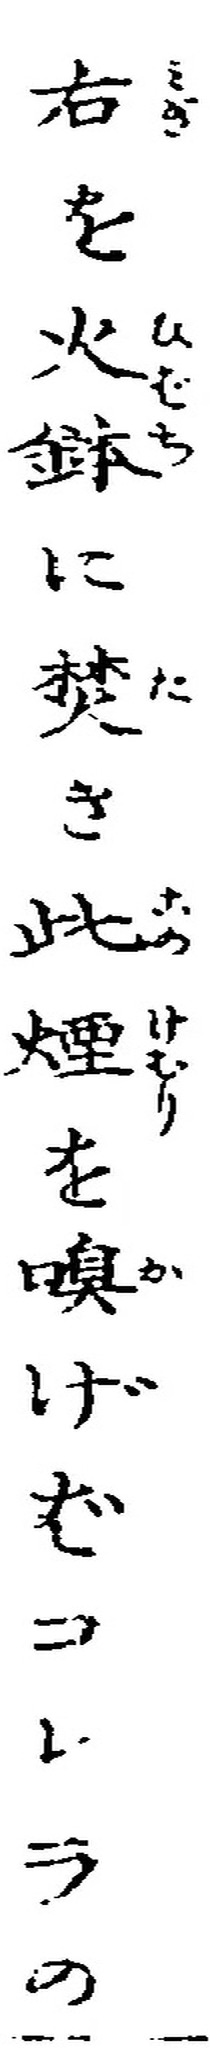右を火鉢に焚き此煙を嗅げばコレラの
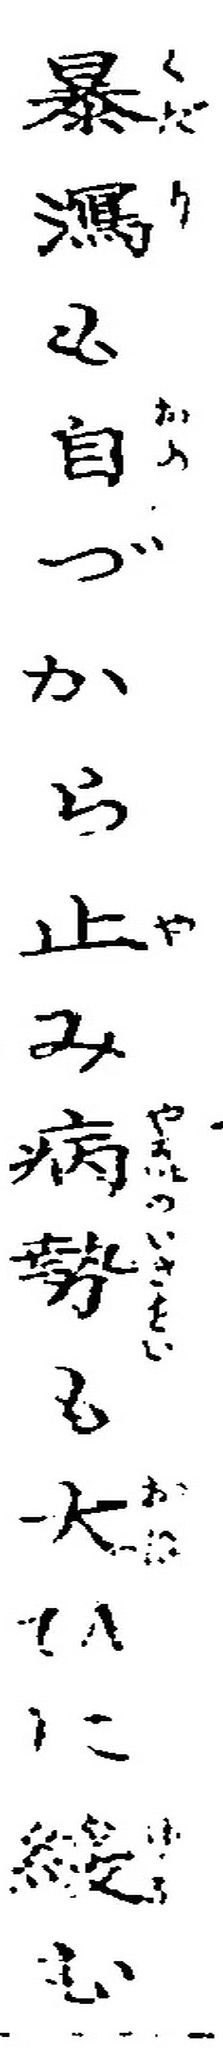暴瀉も自づから止み病勢も大ひに緩む
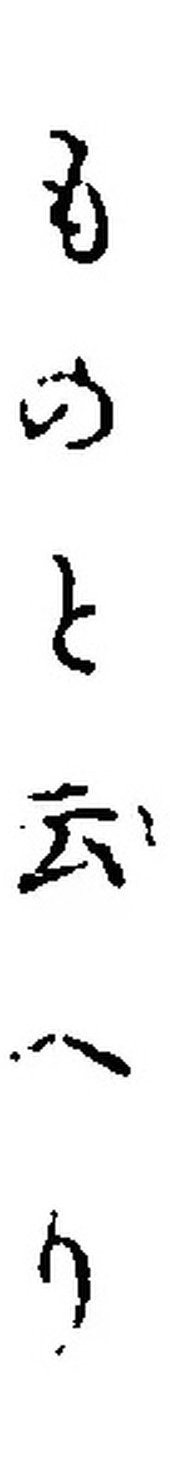ものと云へり
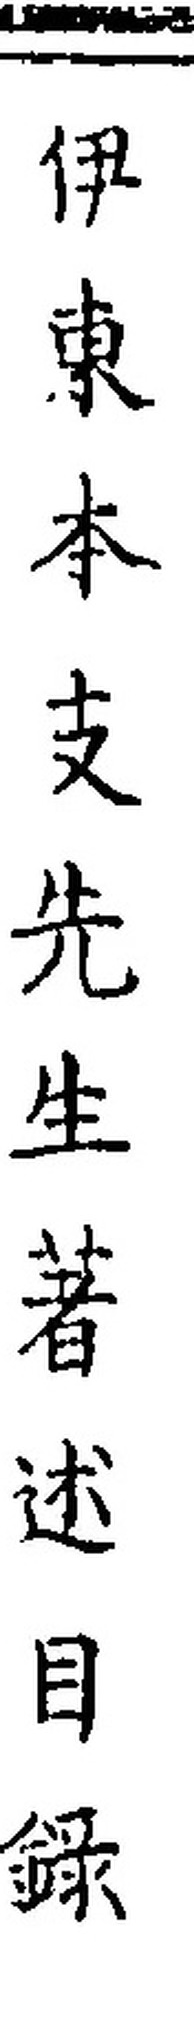伊東本支先生著述目録
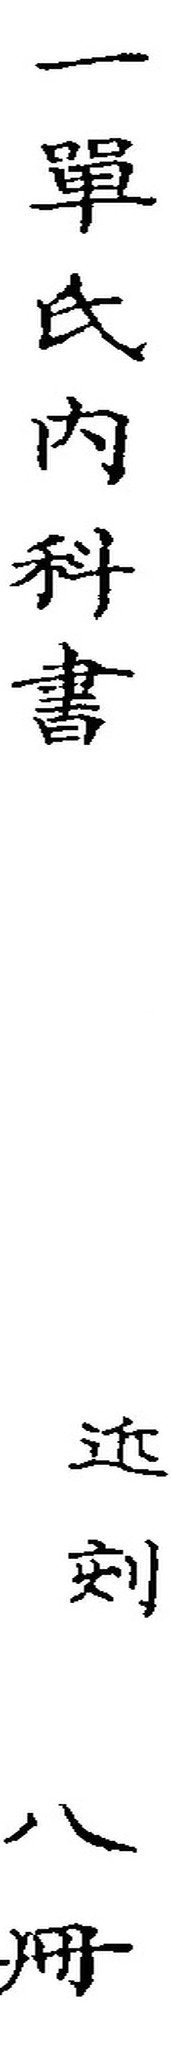一單氏内科書近刻八冊
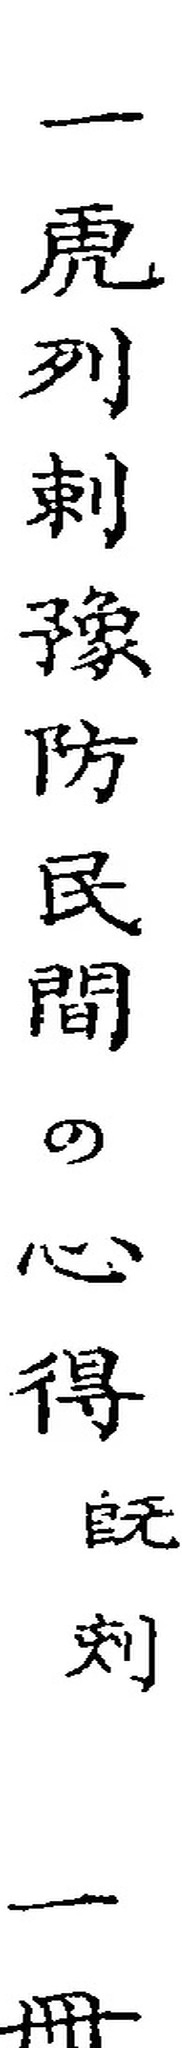一虎列刺予防民間の心得既刻一冊

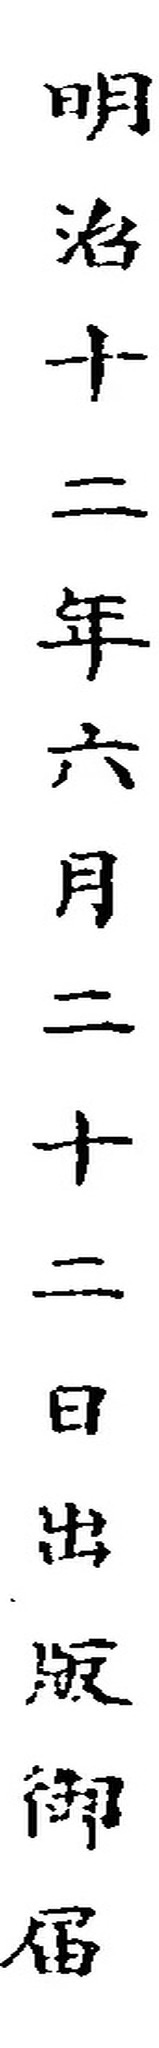明治十二年六月二十二日出版御届
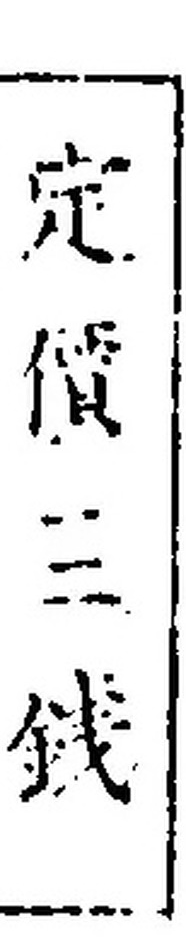定價三銭
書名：虎列剌予防民間の心得
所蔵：国立国会図書館 National Diet Library, JAPAN
